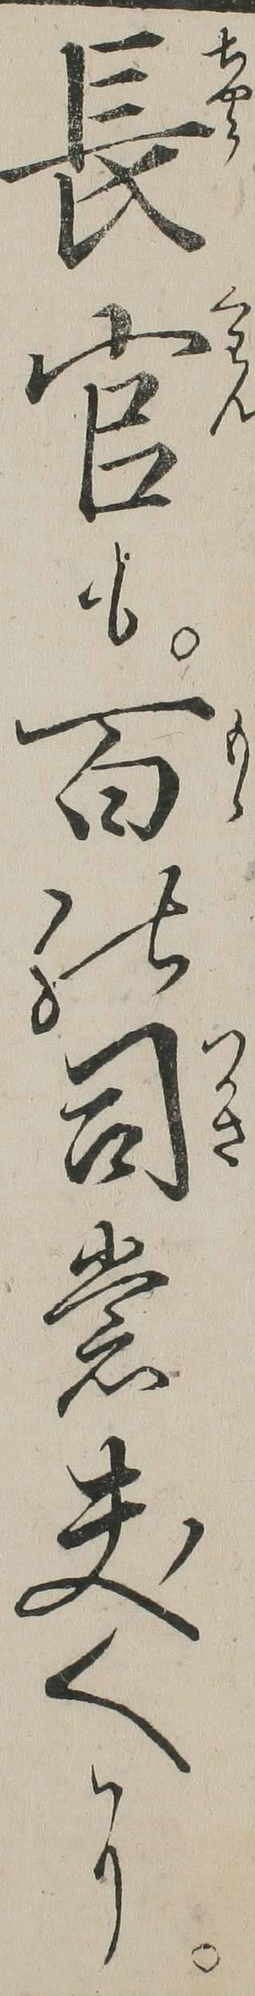長官も。百の司も夫〳〵に。
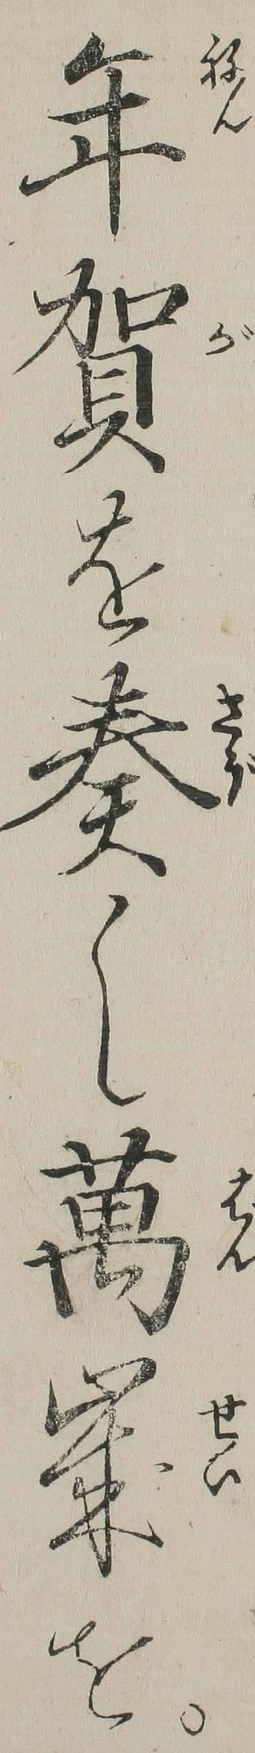年賀を奏し万歳を。
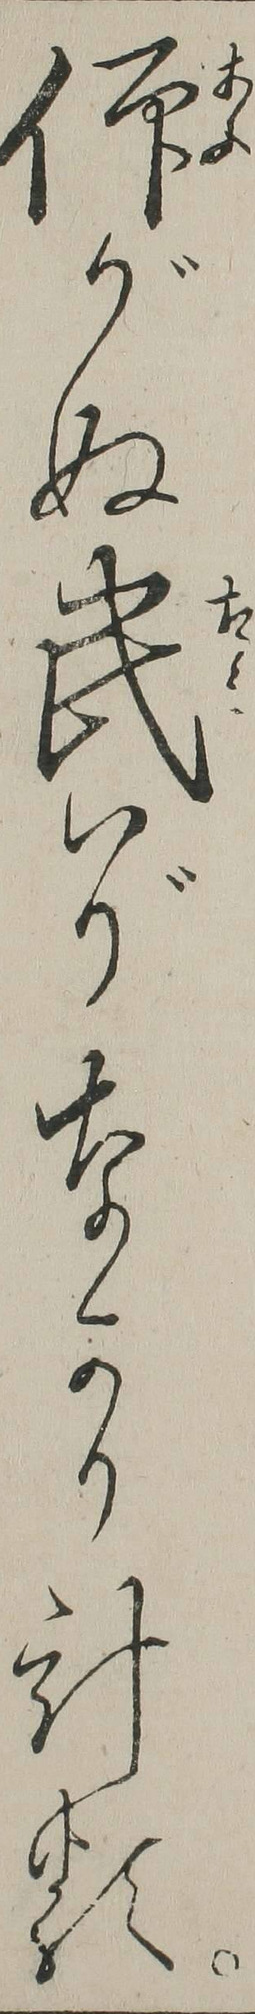仰がぬ民ぞなかりける。
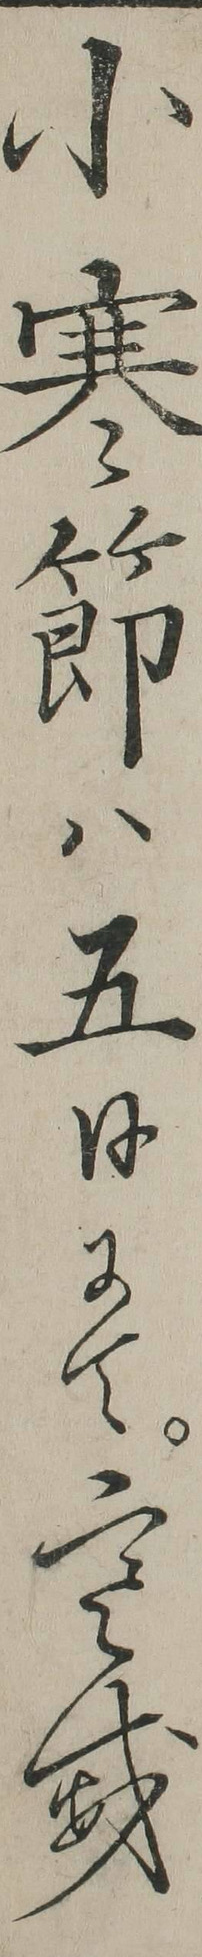小寒節は五日にて。寒威

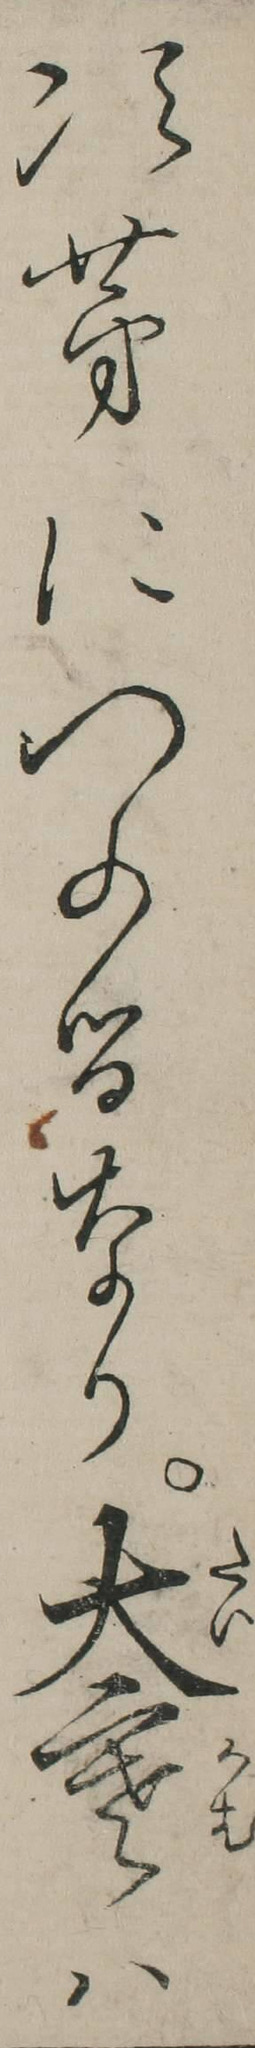次第につのるなり。大寒は
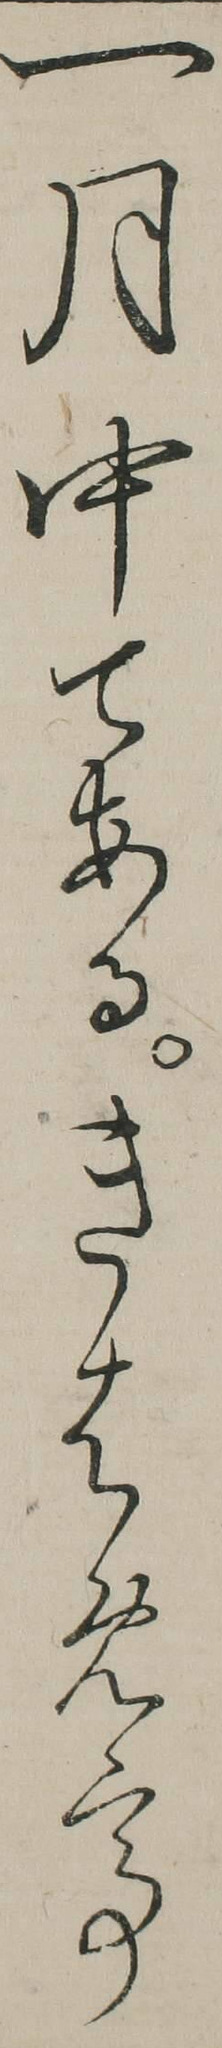一月中てある。きはめて
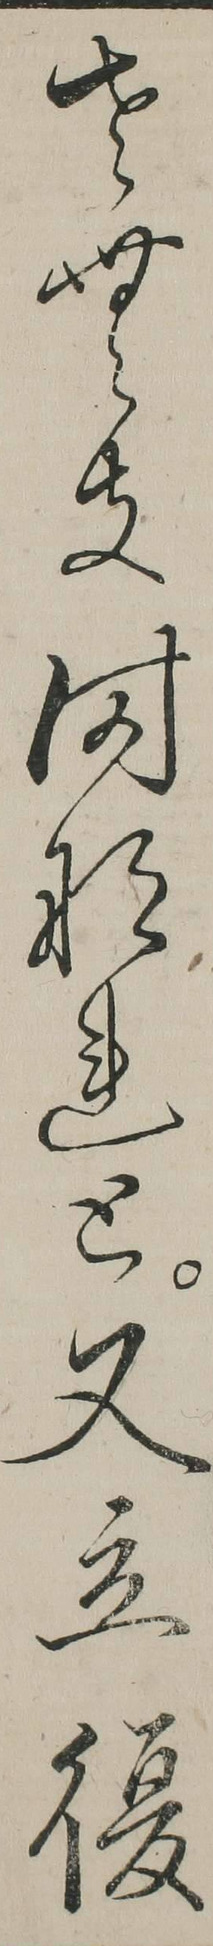さむき時なれと。又立復
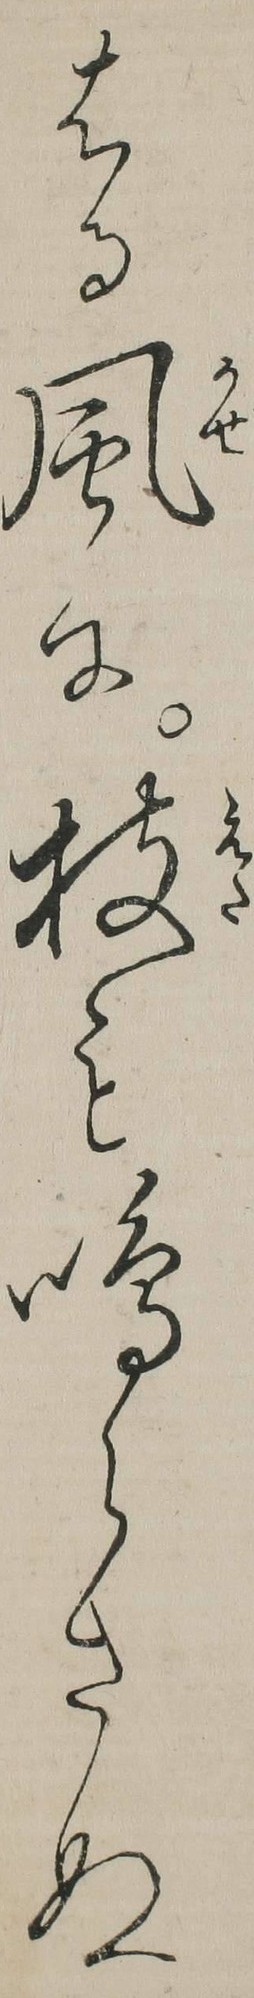はる風に。枝も鳴らさぬ
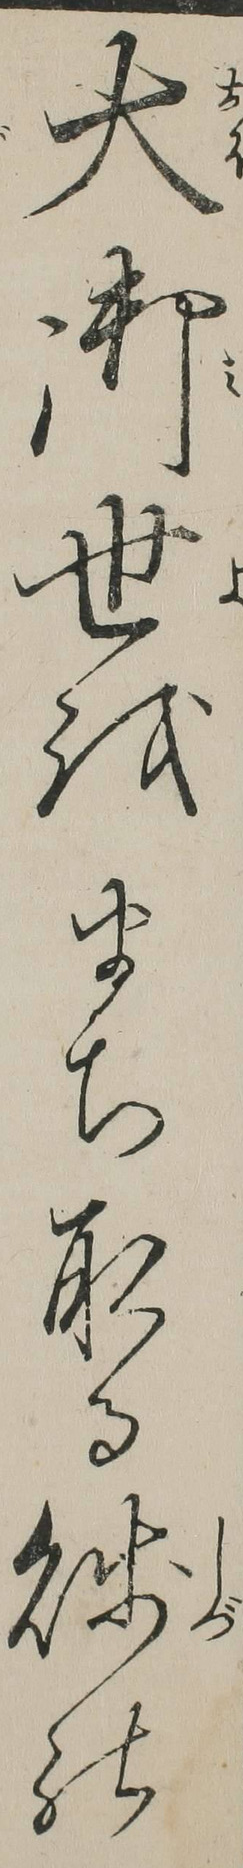大御世をまち取る賤の
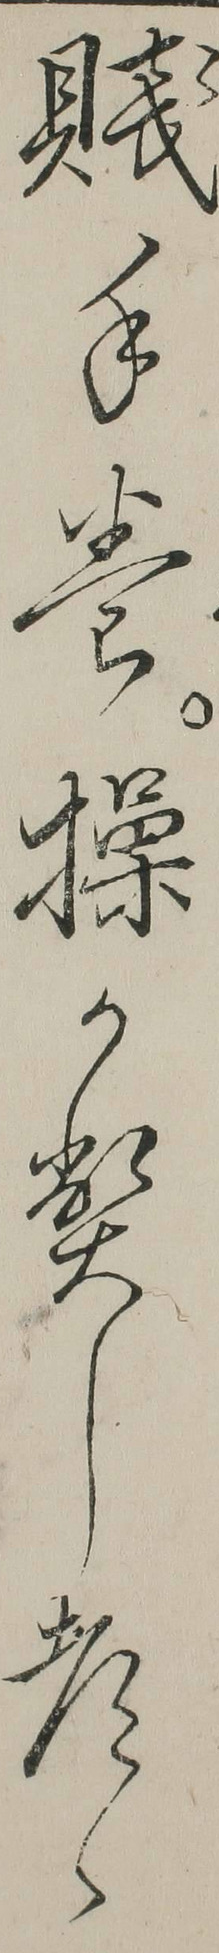賤手巻。操かへしつゝ
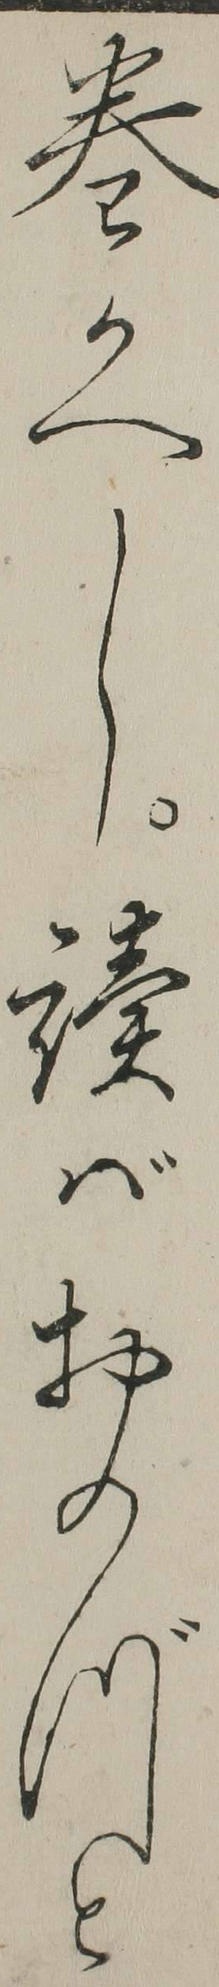巻かへし。読ばおのづと
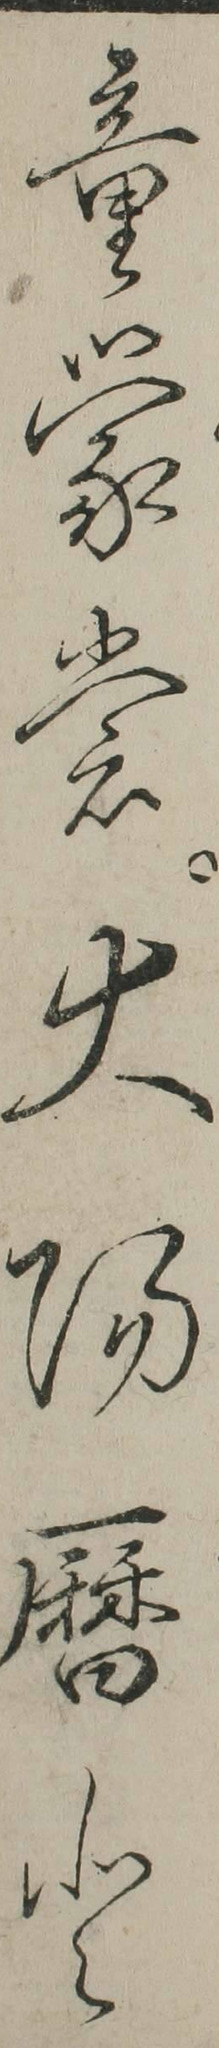童蒙も。大陽暦と

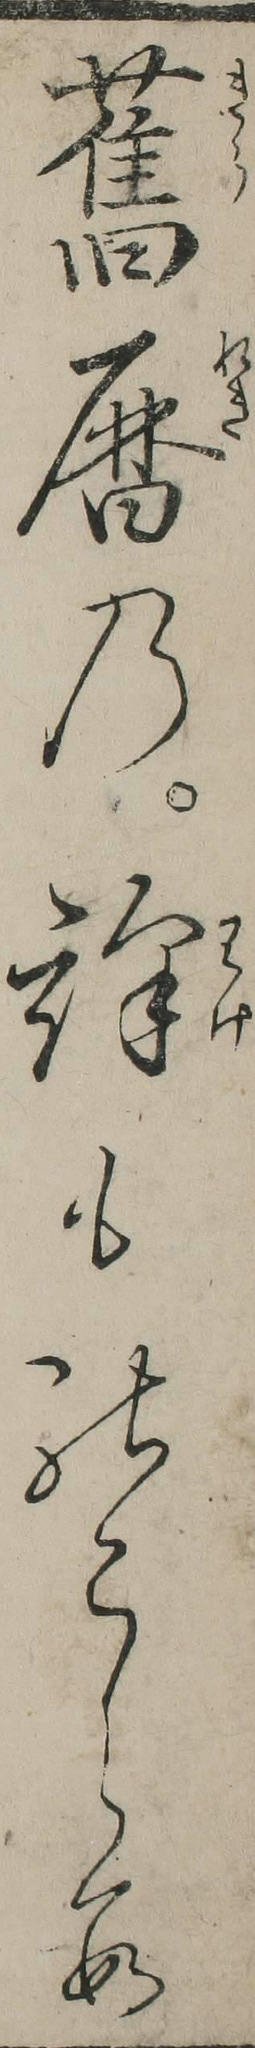旧暦の。訳ものこらす
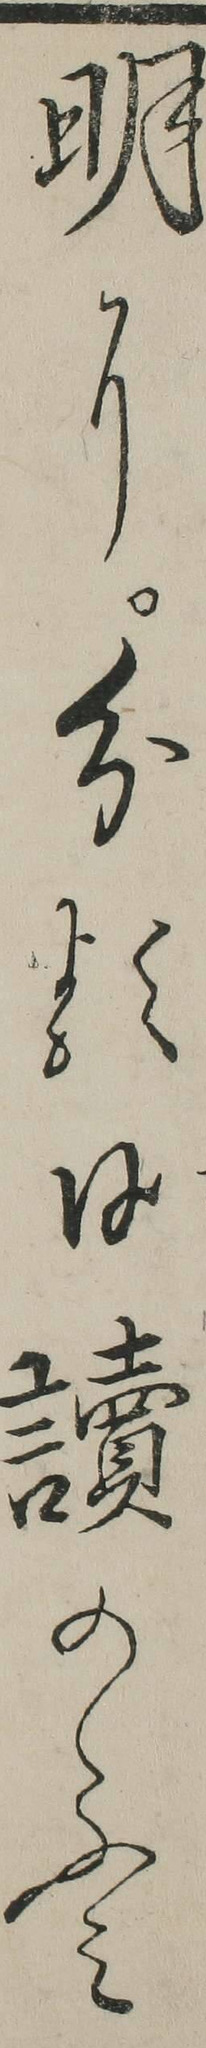明に。分る日読のふみ
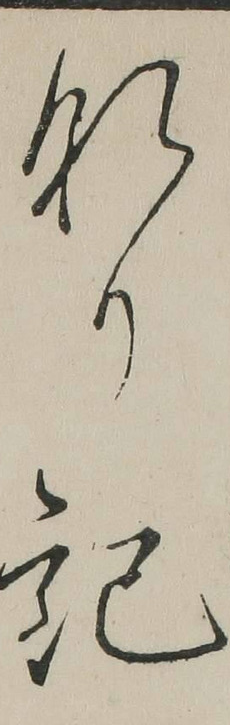なり記
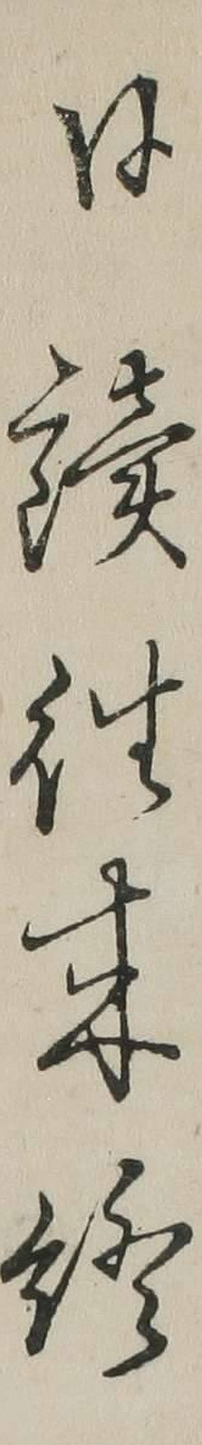日読往来終
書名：農蠶必要日読往来
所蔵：東京学芸大学附属図書館 国文学研究資料館
